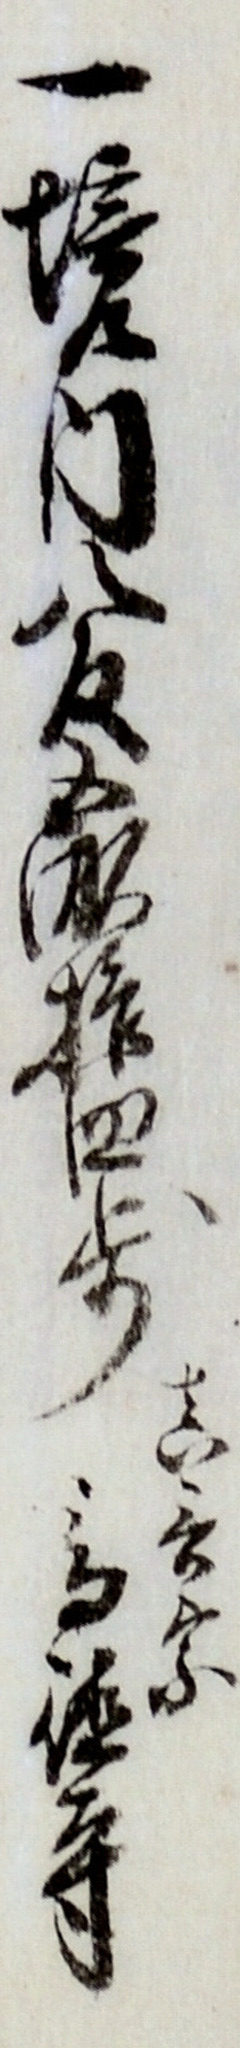一境内八反五畝拾四歩高徳寺
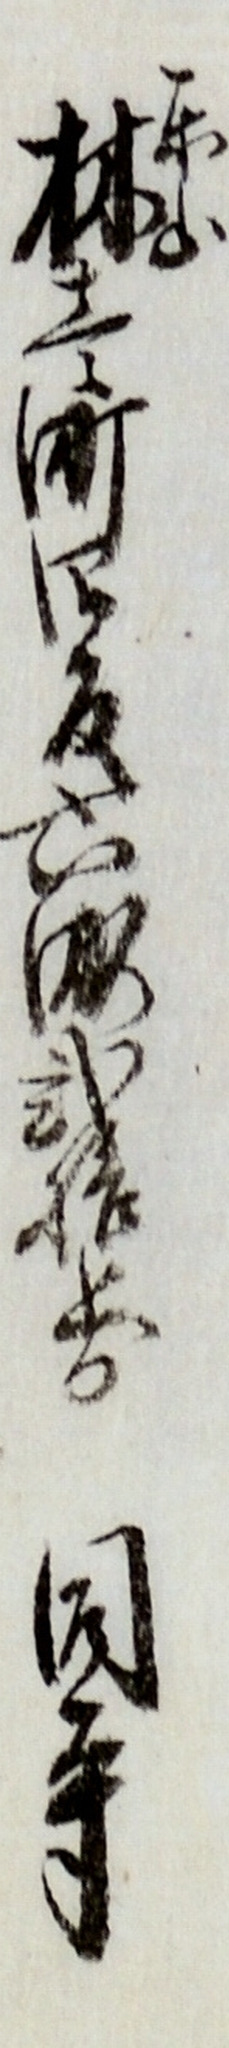林壱町四反六畝弐拾歩同寺
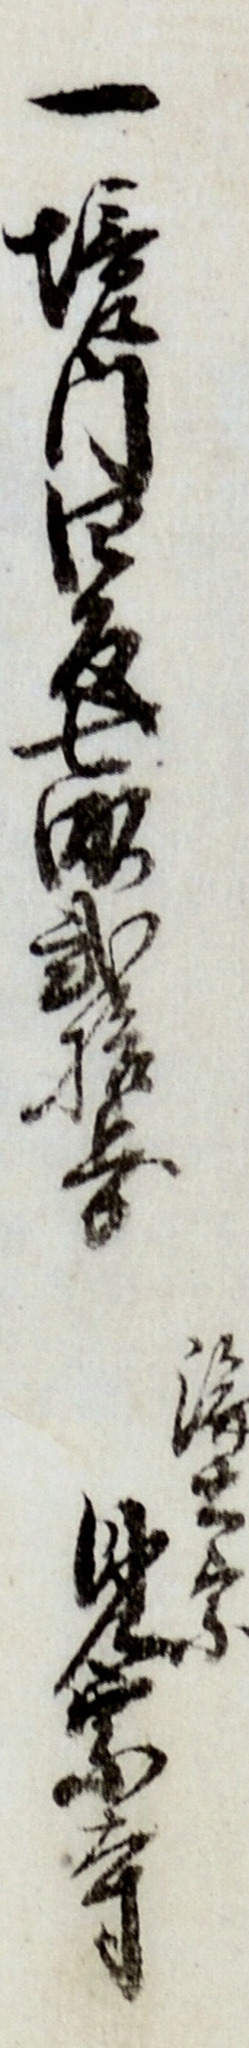一境内四反七畝弐拾歩見宗寺
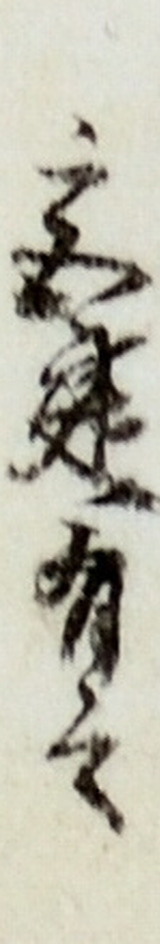宮建有之
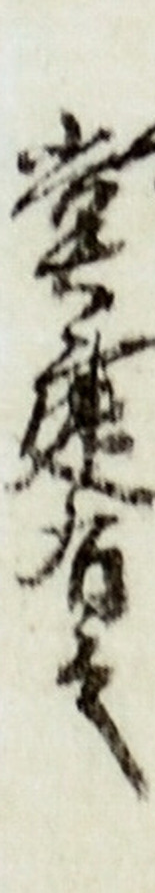堂建有之
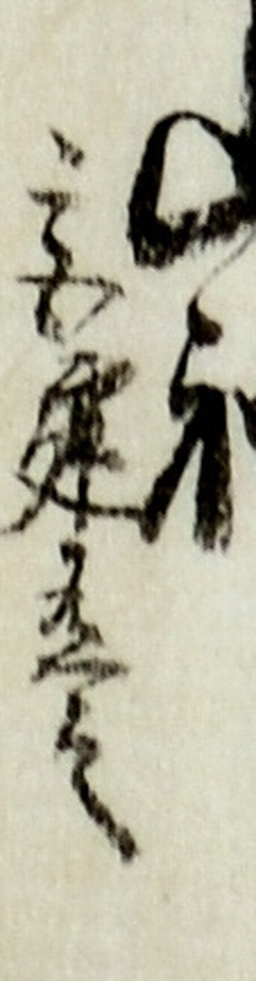宮建有之
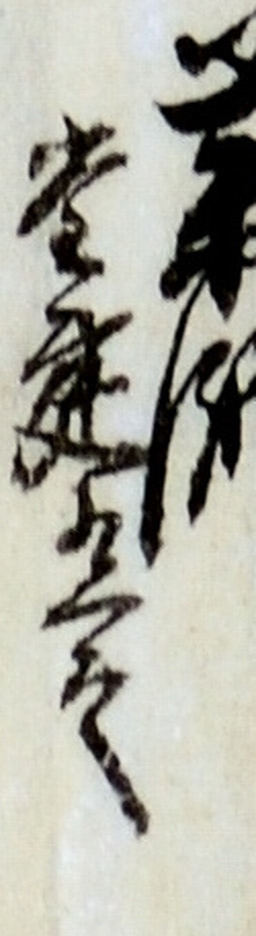宮建有之
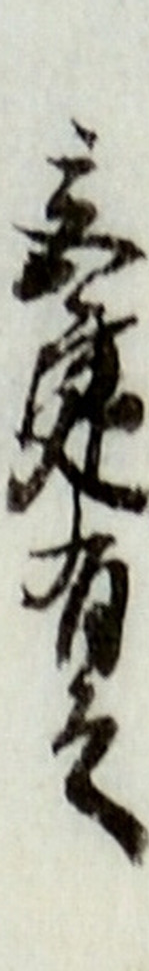宮建有之
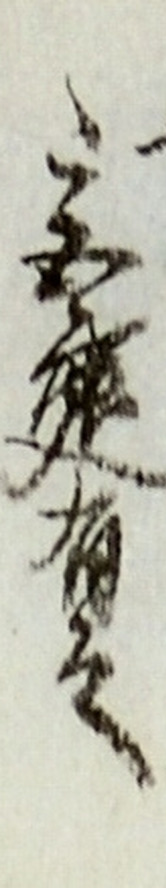宮建有之
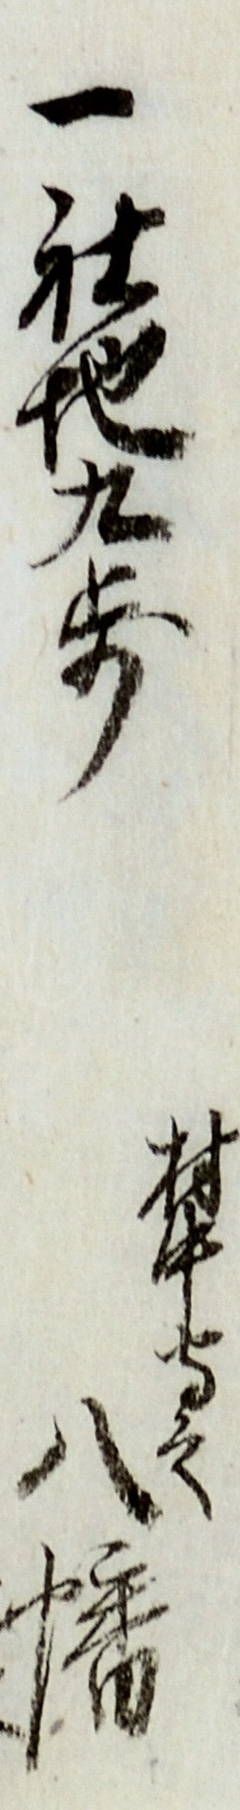一社地九歩八幡
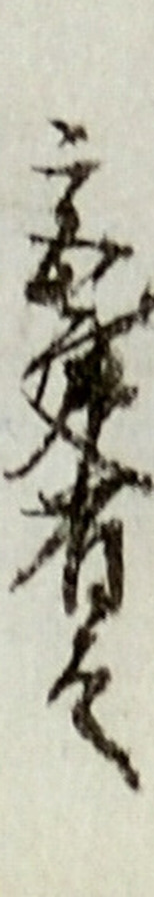宮建有之
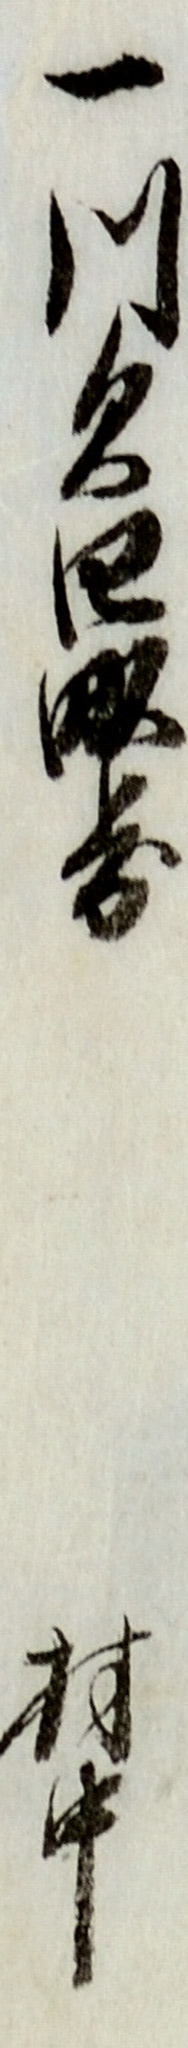一川欠四畝歩村中
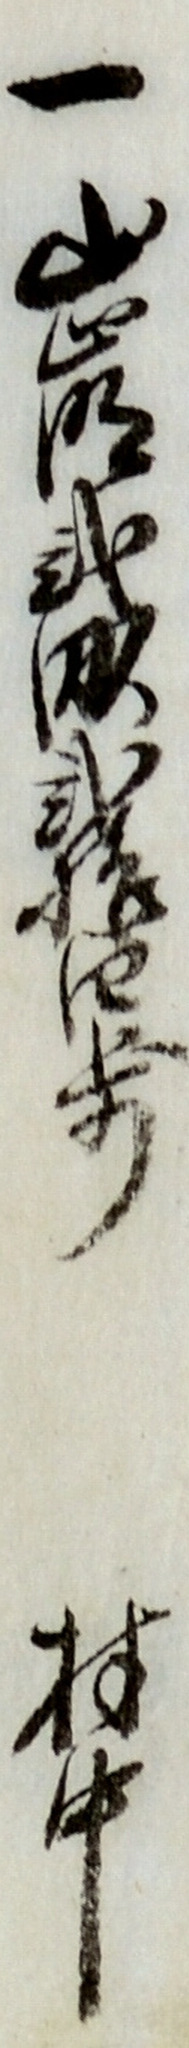一山崩弐畝弐拾四歩村中
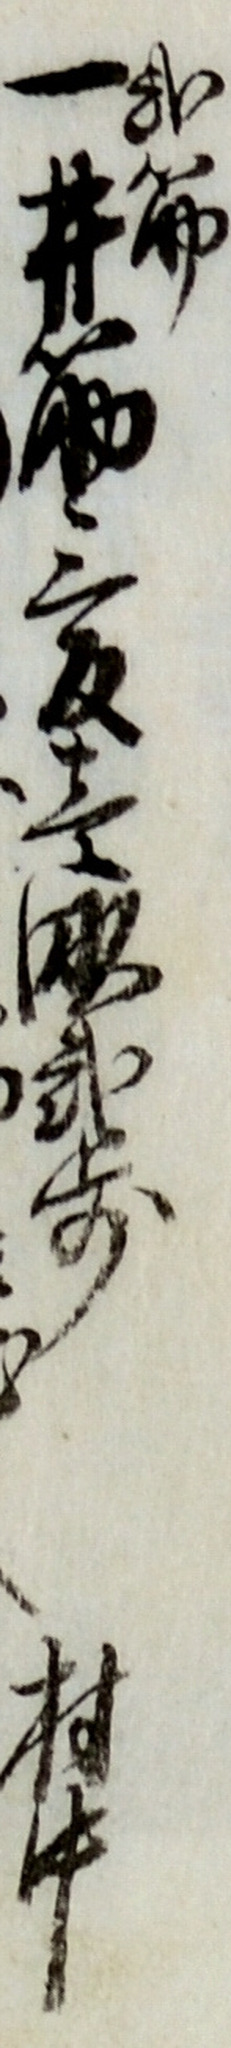一井筋三反壱畝弐歩村中
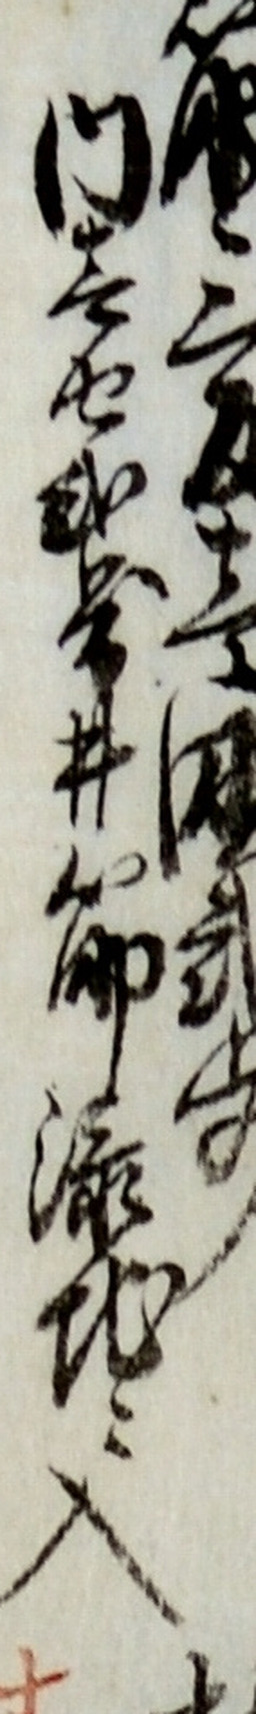内壱セ弐歩井筋添地ニ入

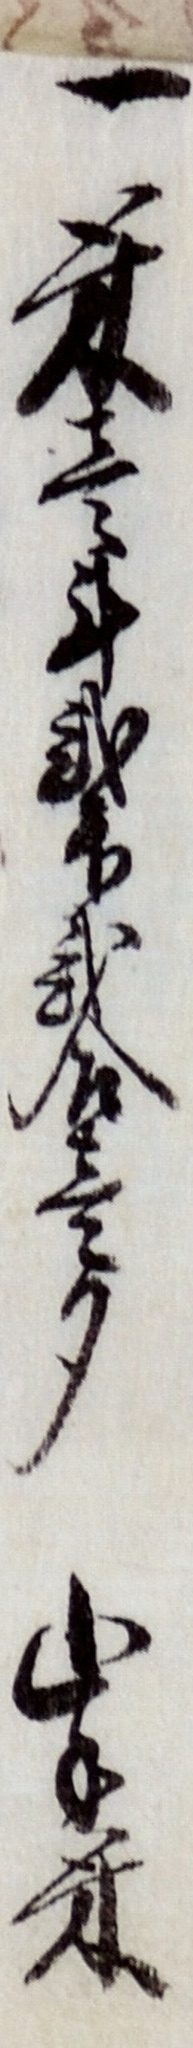一米壱斗弐升弐合壱勺山手米
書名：御領分中山林社地手控
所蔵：伊那市立高遠町図書館・合同会社AMANE
